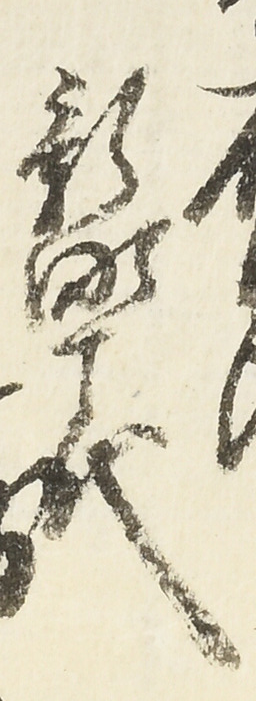新町丁代
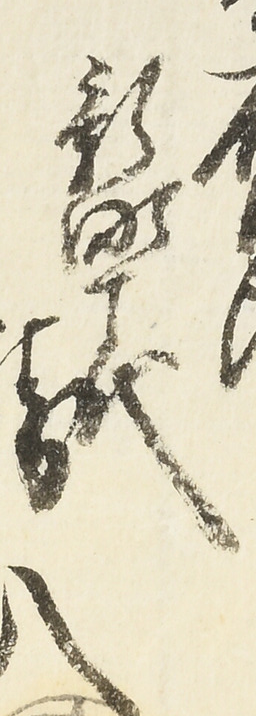新町丁代

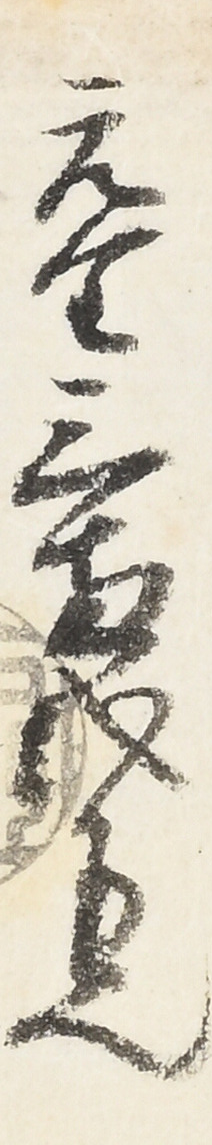元金三両弐分也
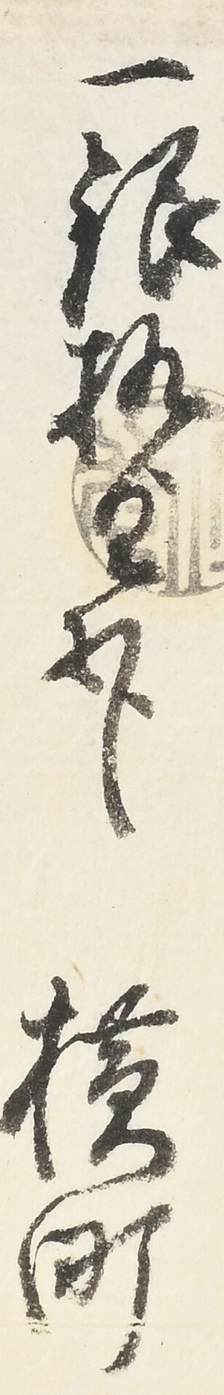一銀拾匁五分横町
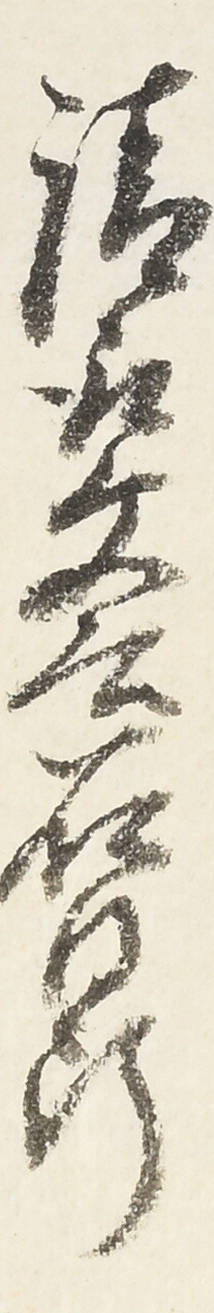請取文言右同断
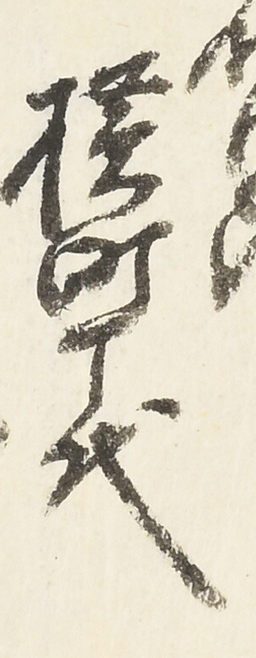横町丁代
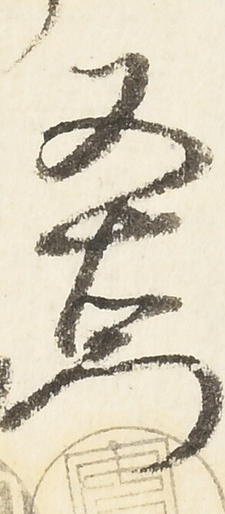未又右衛門
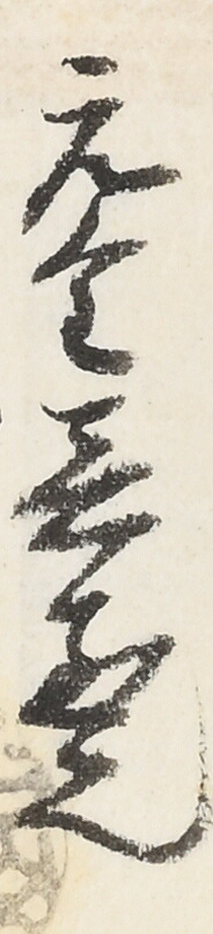元金壱両也
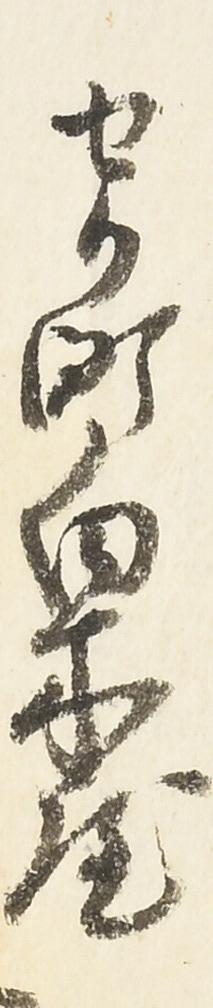せり町白木屋
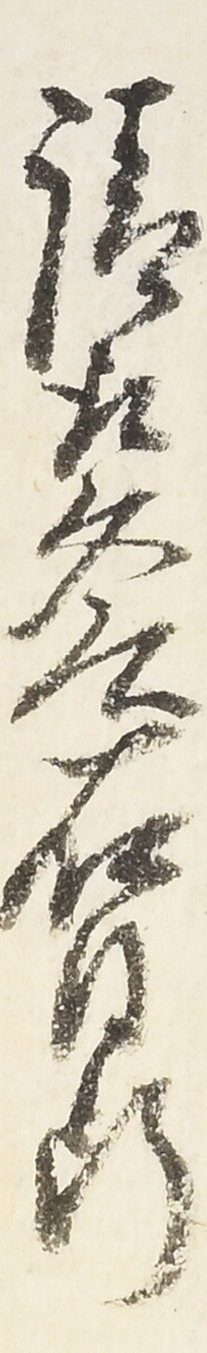請取文言右同断
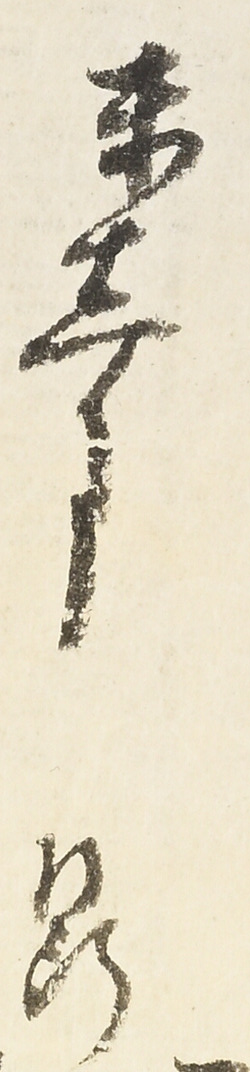十二月同断
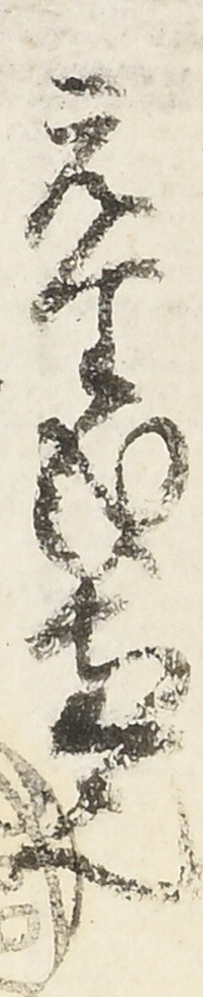元金壱両也
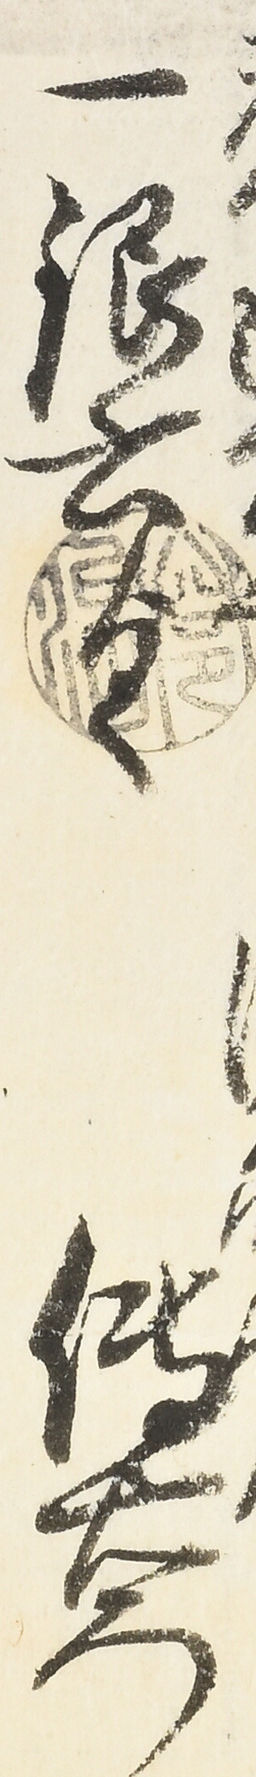一銀六匁伝右衛門
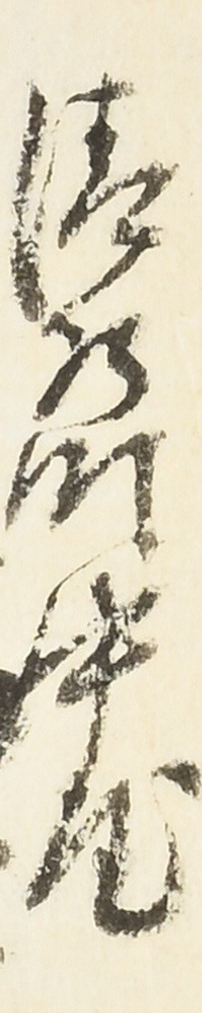清水町丁代
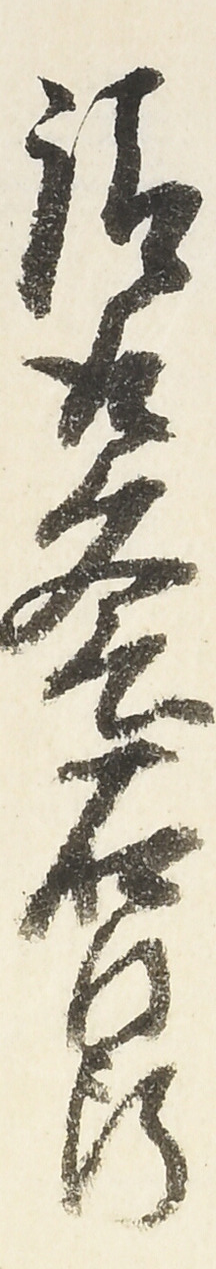請取文言右同断
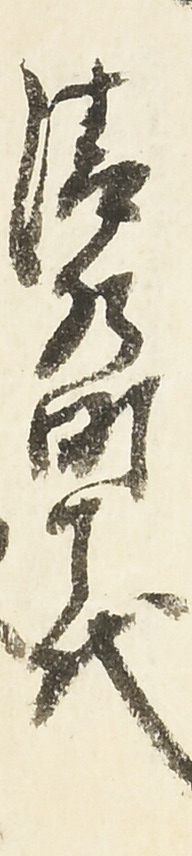清水町丁代
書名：御才覚金御利足割渡扣帳
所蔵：伊那市立高遠町図書館・合同会社AMANE
